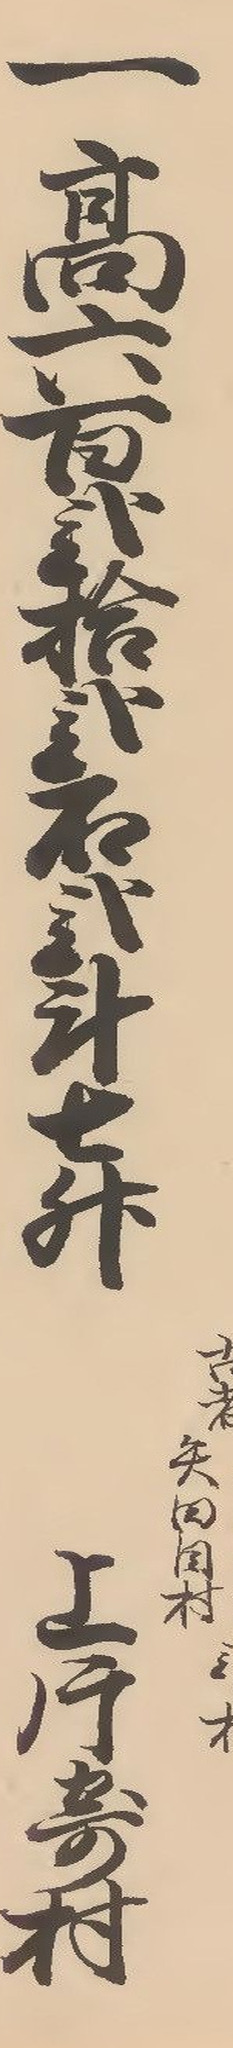一高六百弐拾弐石弐斗七升上片寄村
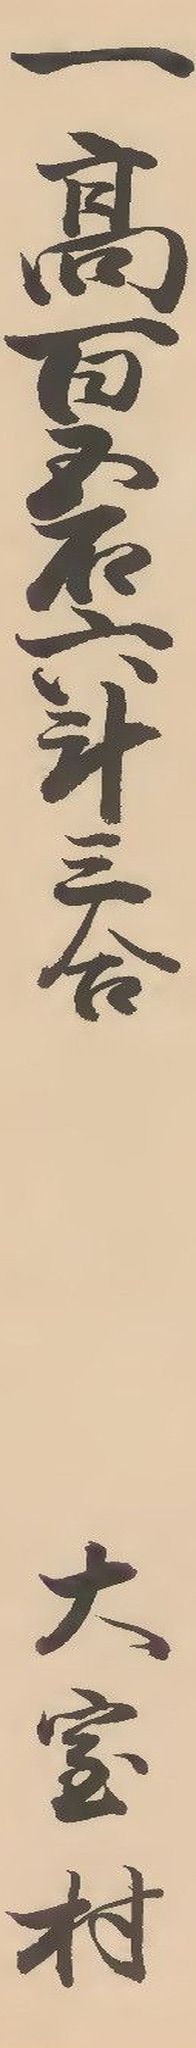一高百五石六斗三合大室村

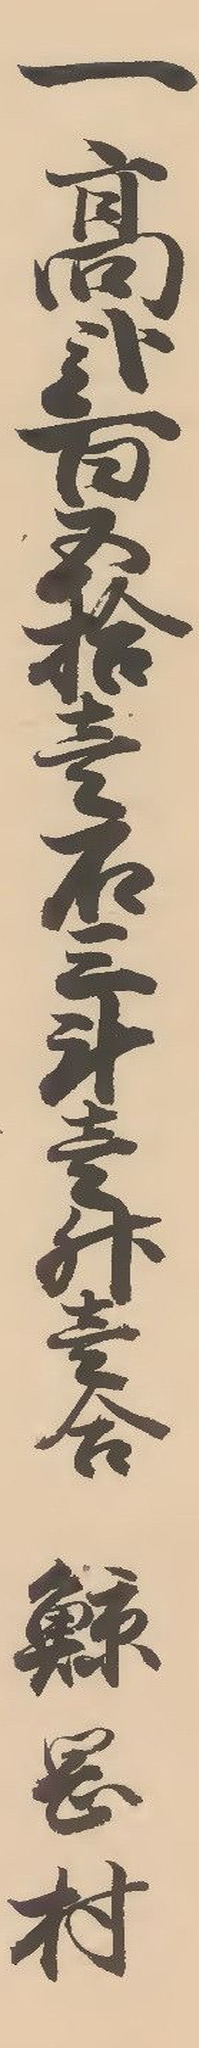一高弐百五拾壱石三斗壱升壱合鯨岡村
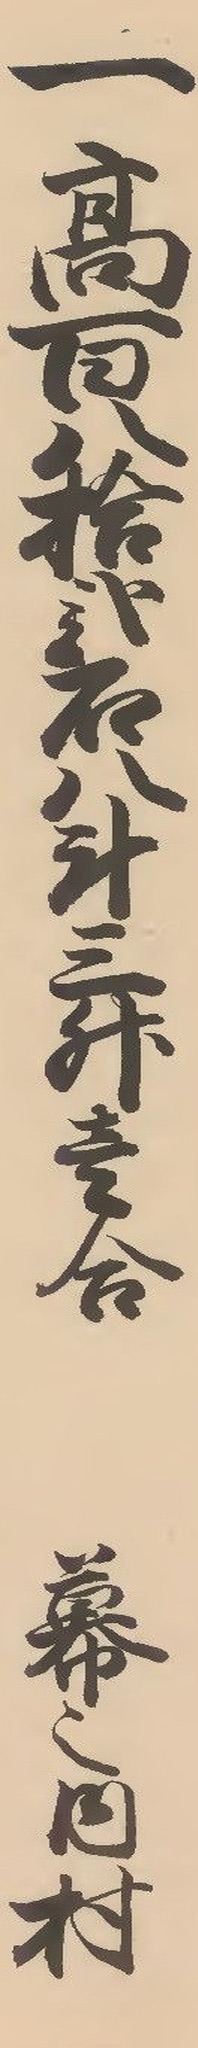一高百八拾弐石八斗三升壱合幕之内村
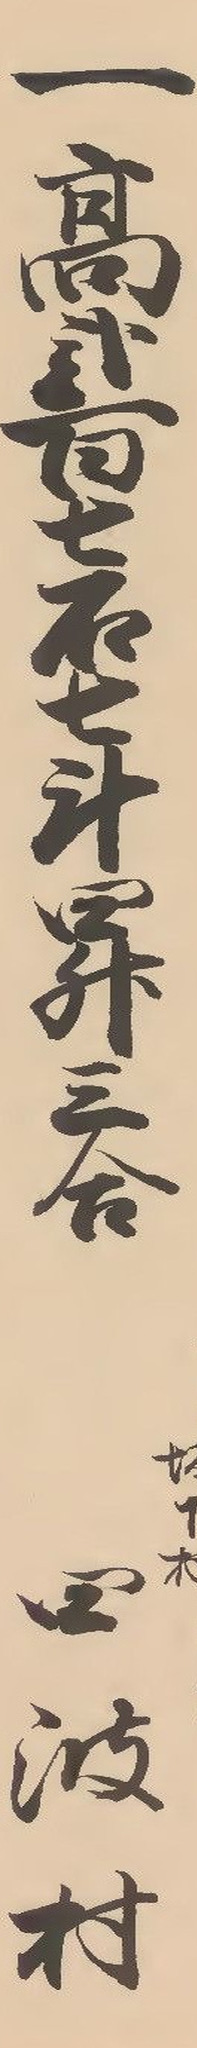一高弐百七石七斗四升三合四波村
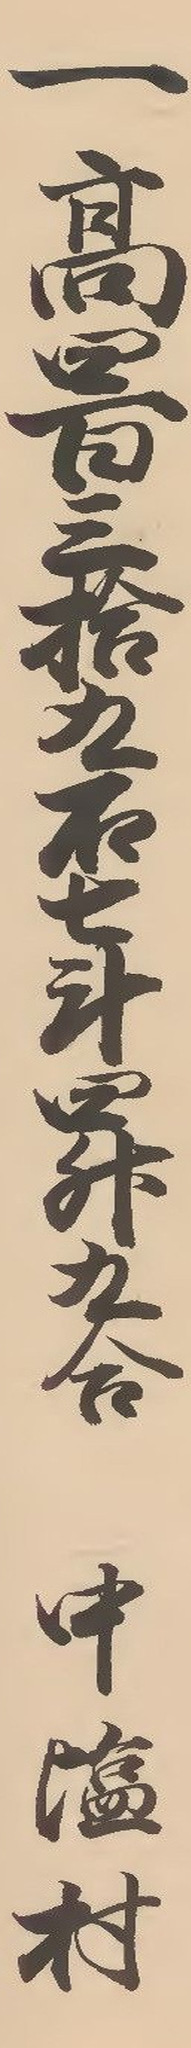一高四百三拾九石七斗四升九合中塩村
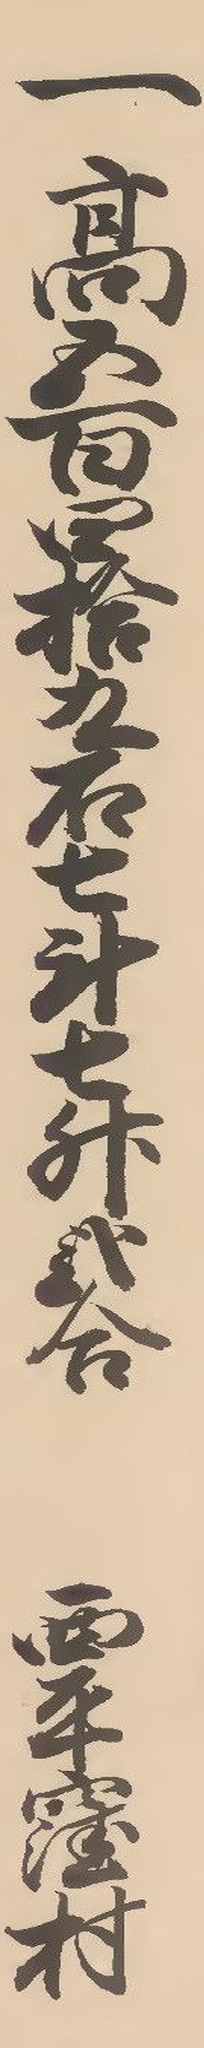一高五百四拾九石七斗七升弐合西平窪村
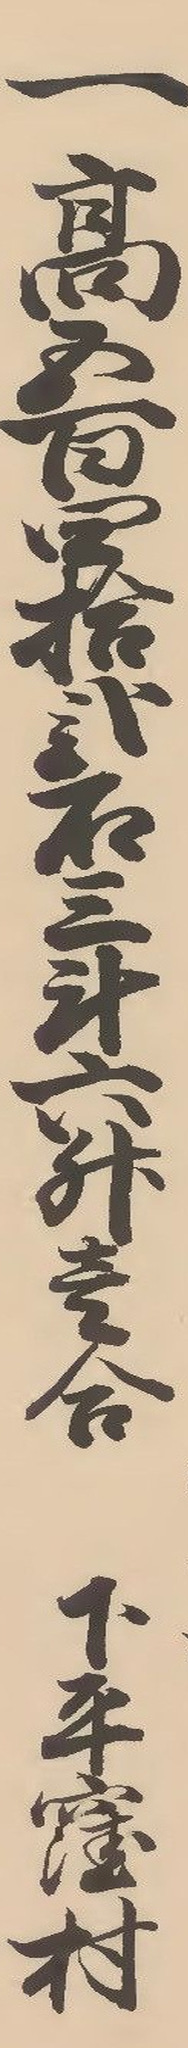一高五百四拾弐石三斗六升壱合下平窪村
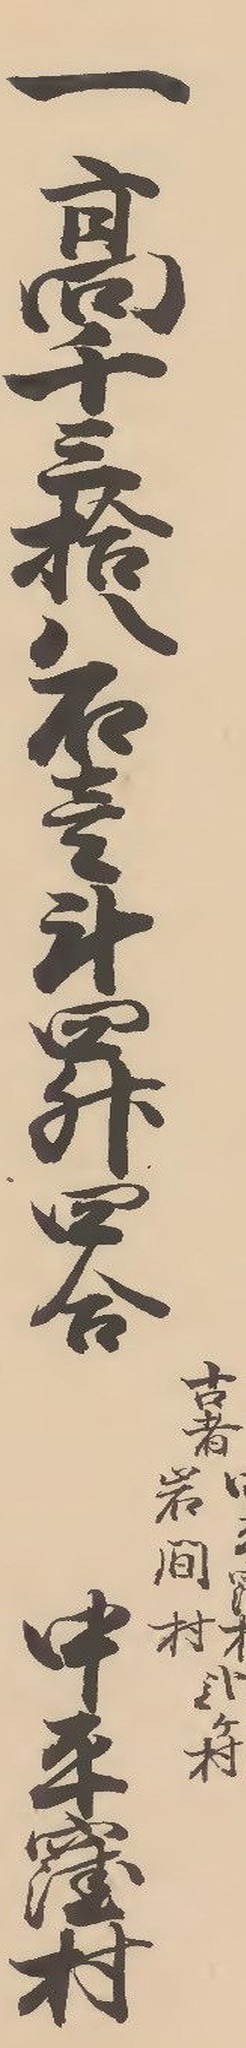一高千三拾八石壱斗四升四合中平窪村

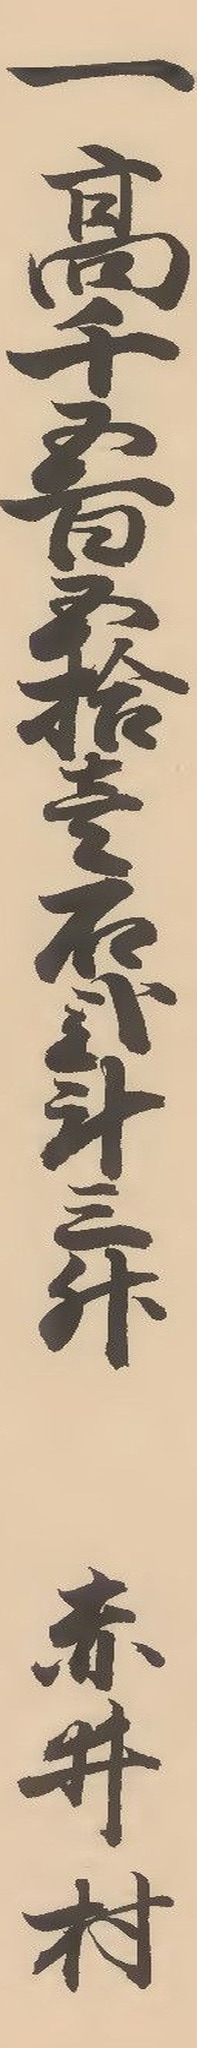一高千五百五拾壱石弐斗三升赤井村
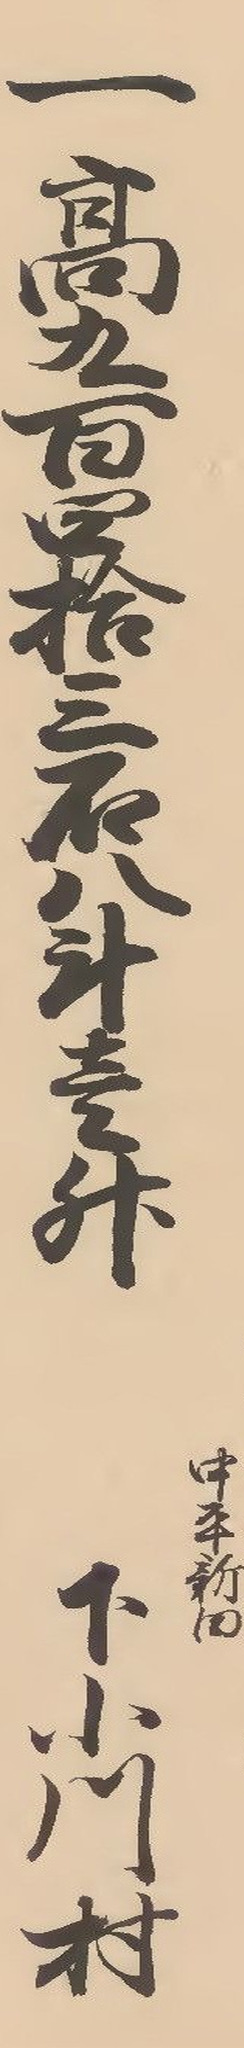一高九百四拾三石八斗壱升下小川村
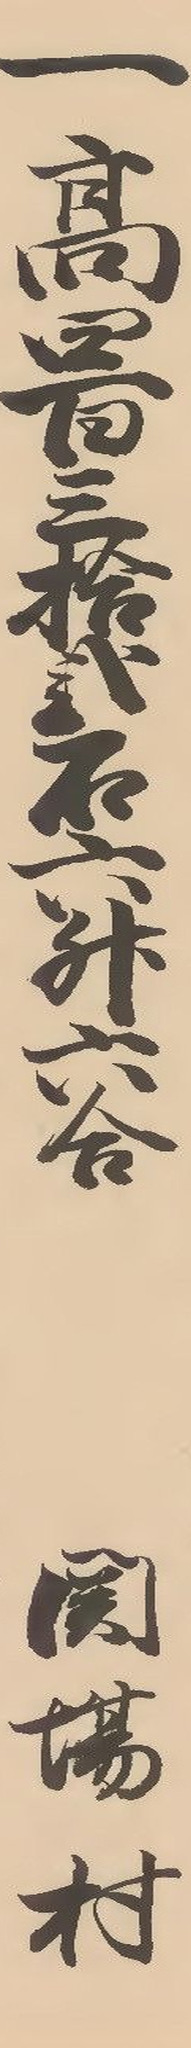一高四百三拾弐石六升六合関場村
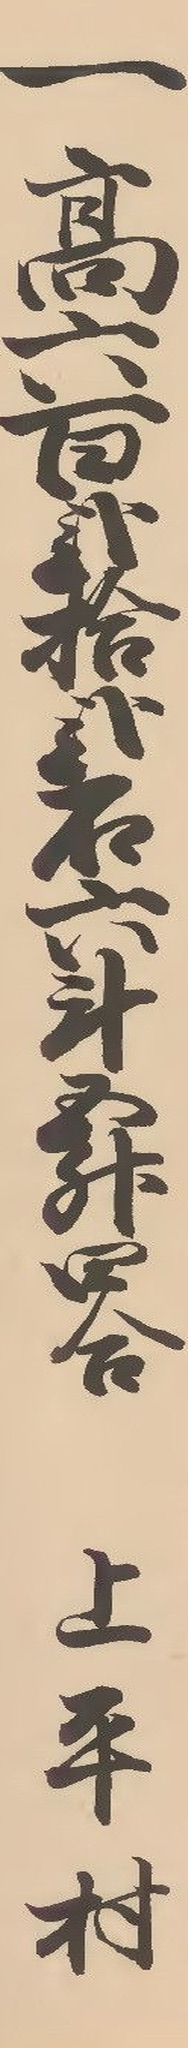一高六百弐拾弐石六斗五升四合上平村
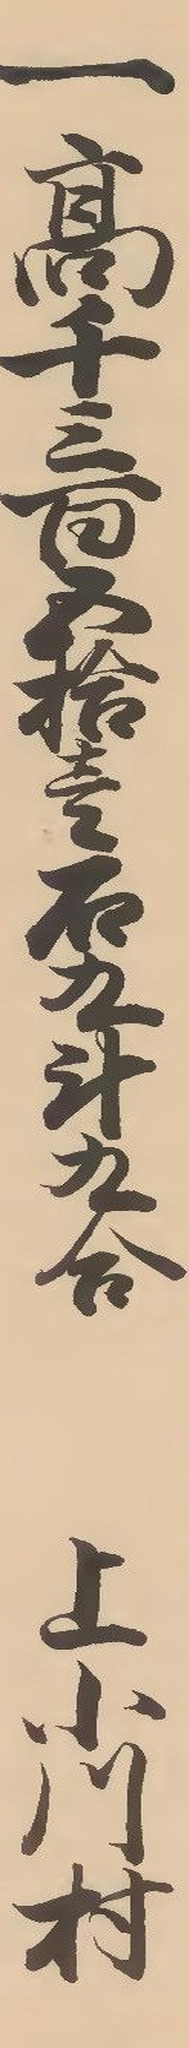一高千三百五拾壱石九斗九合上小川村
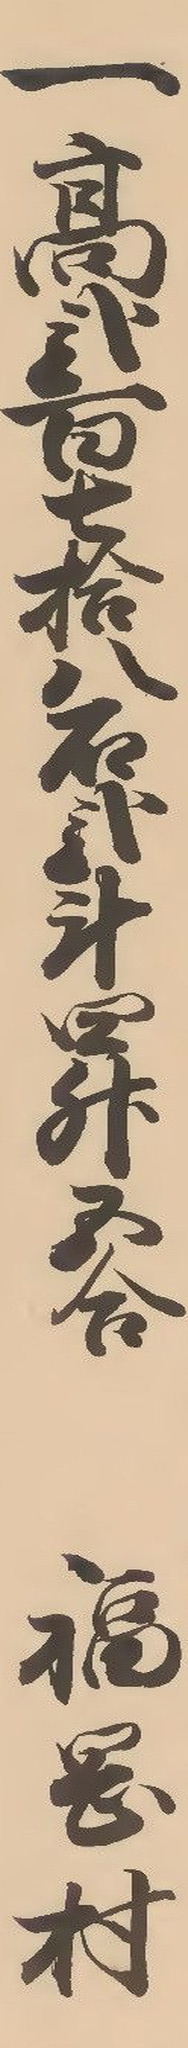一高弐百七拾八石弐斗四升五合福岡村
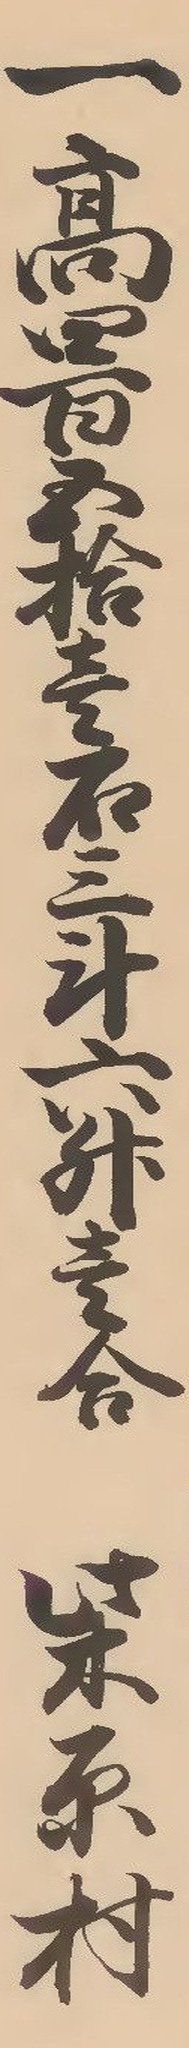一高四百五拾壱石三斗六升壱合柴原村
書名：陸奥国郷帳　３
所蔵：国立公文書館 National Archives of Japan
